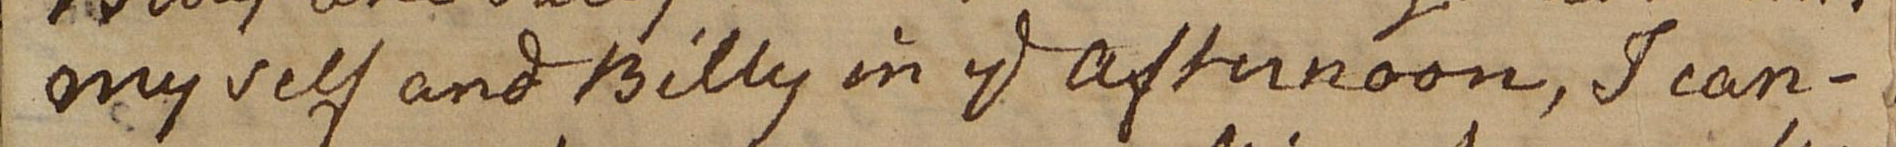my self and Billy in y^e Afternoon, I can-
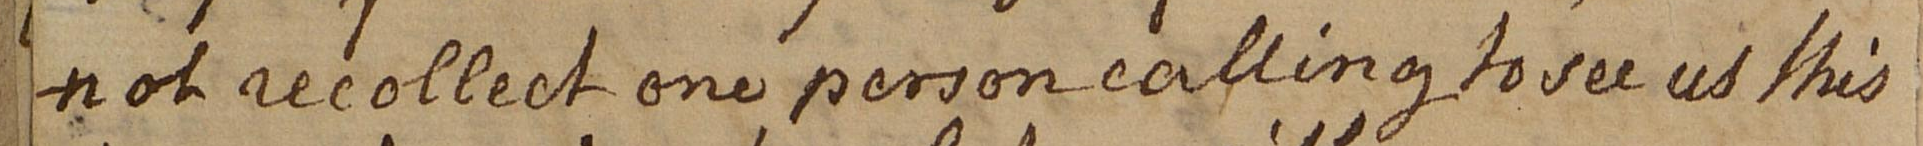not recollect one person calling to see us this
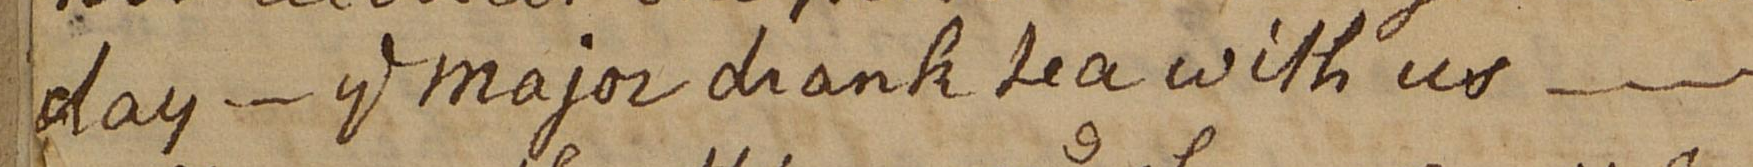day- y^e Major drank tea with us-
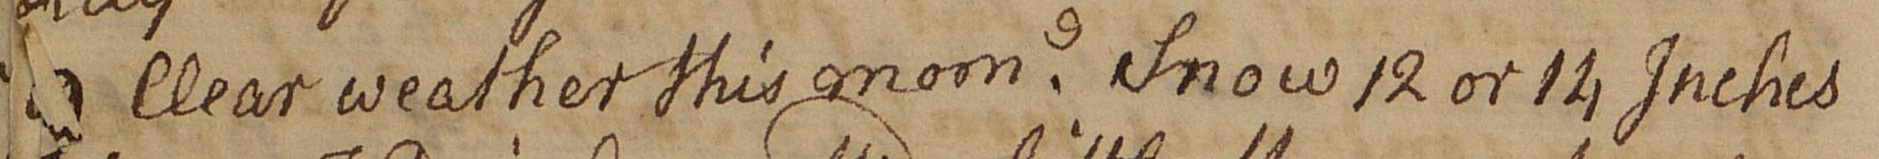Clear weather this morn^g. Snow 12 or 14 Inches
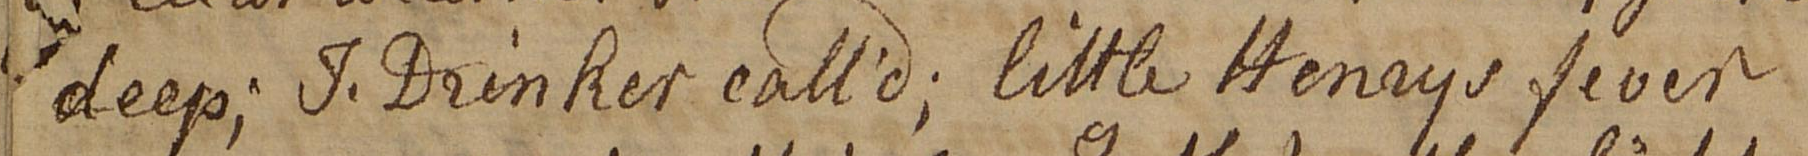deep; J. Drinker call'd; little Henrys fever
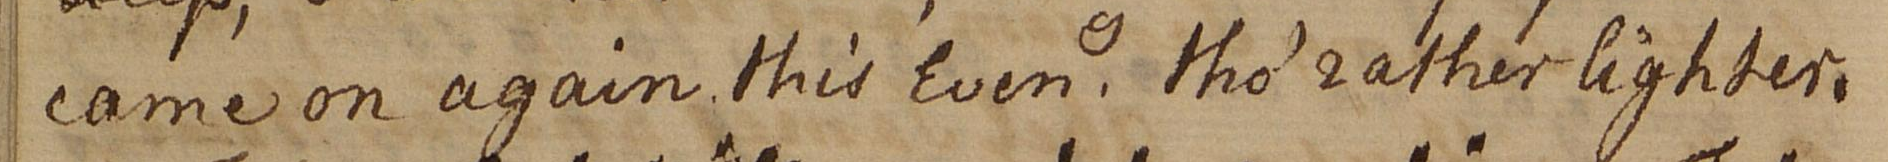came on again this Even^g. tho' rather lighter.
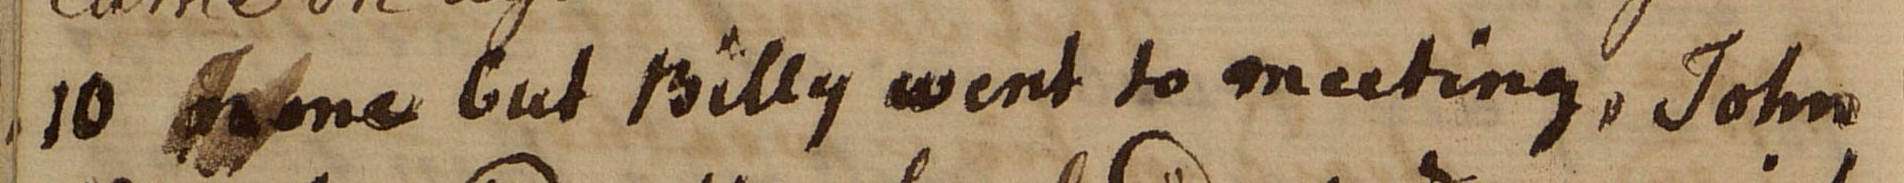10 none but Billy went to meeting, John
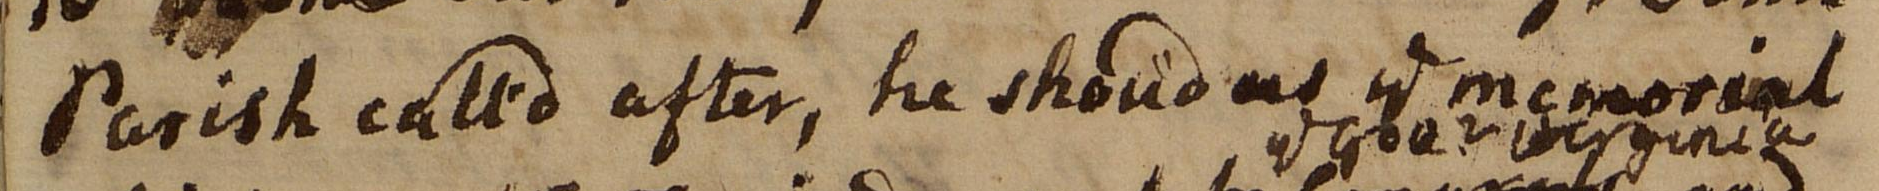Parish call'd after, he shoud us y^e memorial
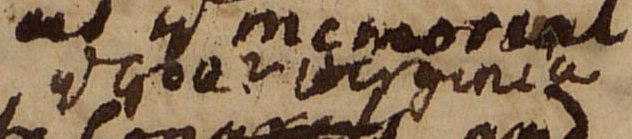y^e Gov^r. Virginia
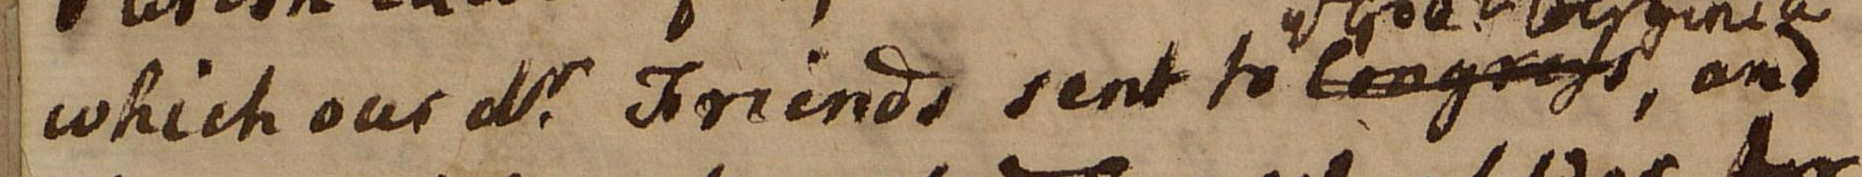which our d^r. Friends sent to Congress, and
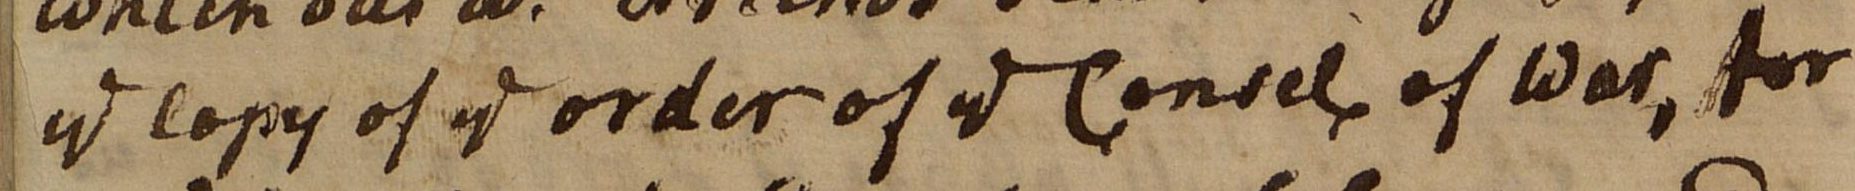y^e copy of y^e order of y^e Consel of War, for
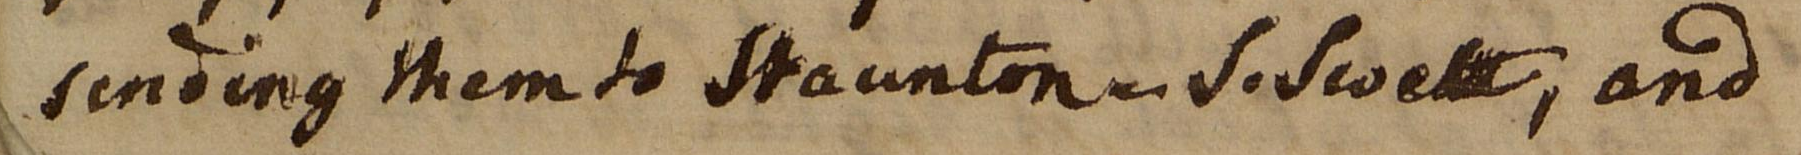sending them to Staunton- S. Swett, and
